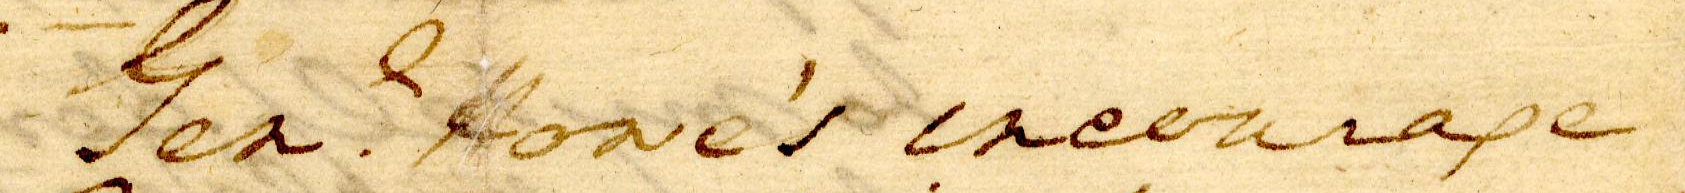Gen^l. Howe's encourage
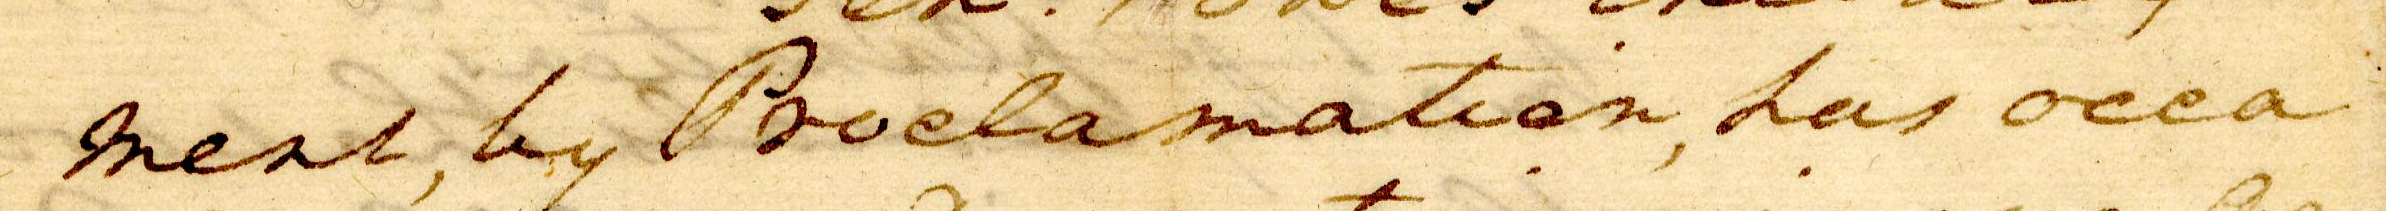ment, by Proclamation, has occa-
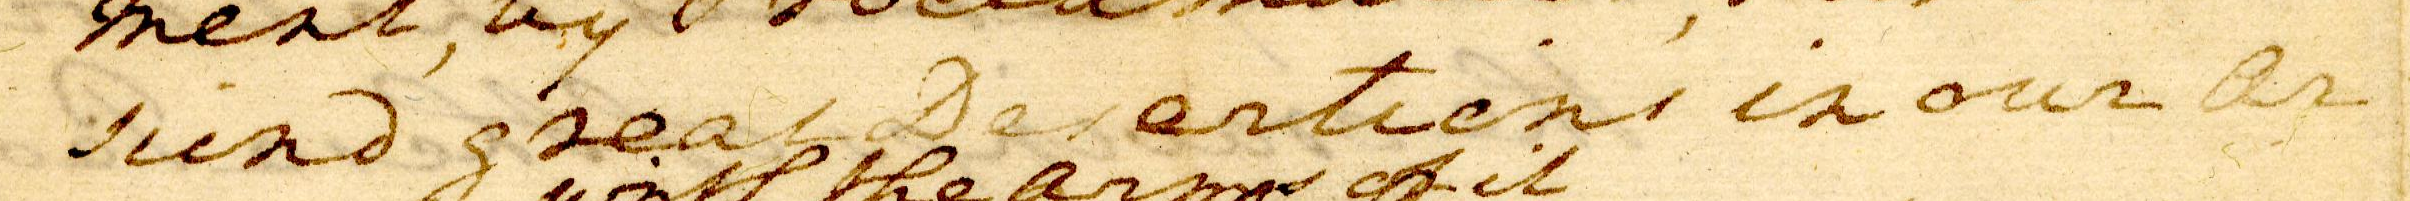-siond great Desertions in our Ar
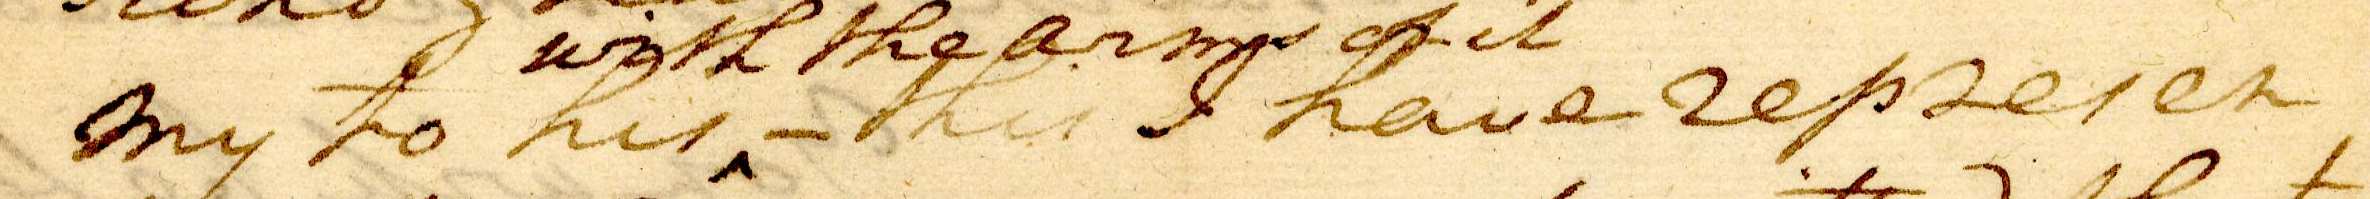my to his ^ - this I have represen
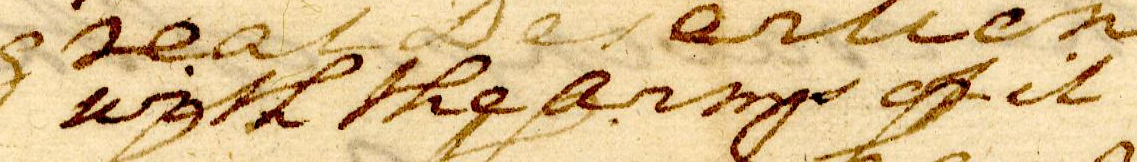with the armys of it
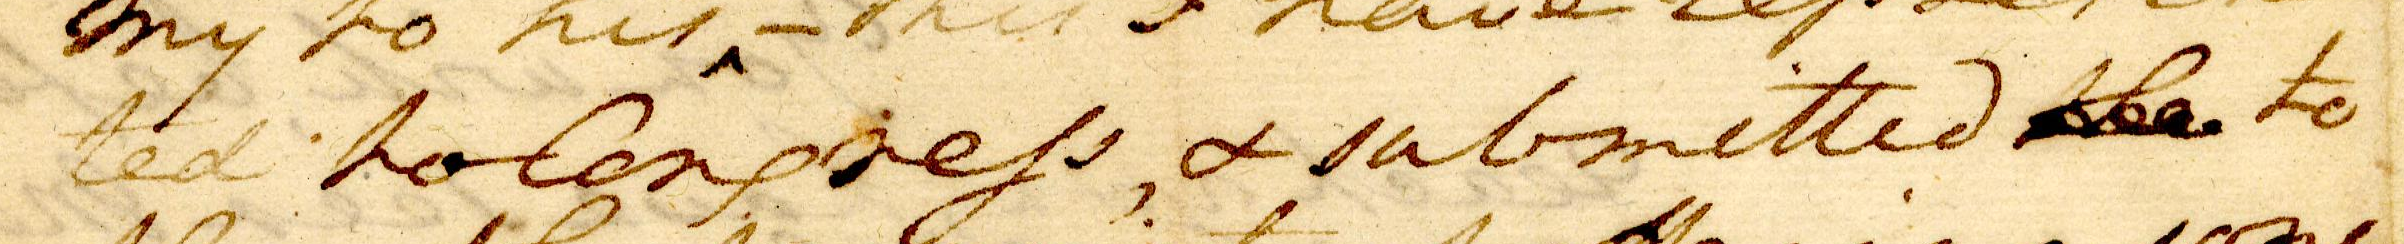ted to Congress, & submitted [the] to
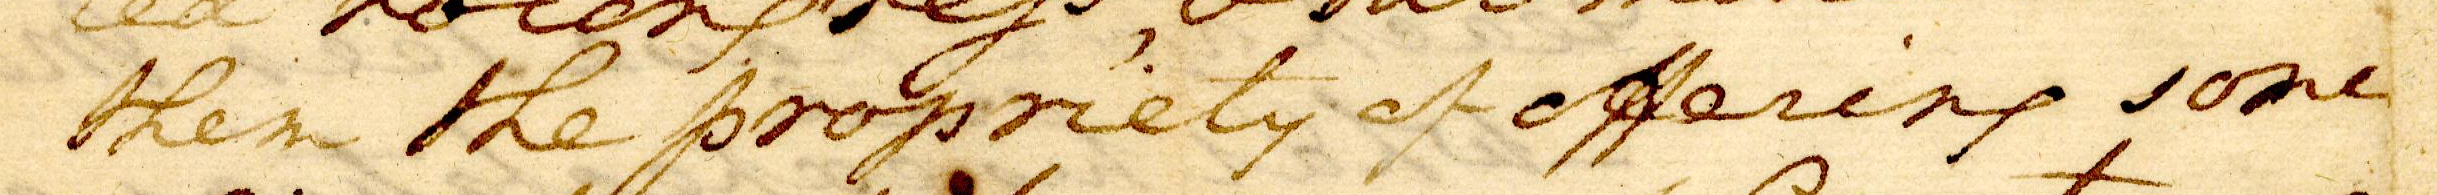them the propriety of offering some
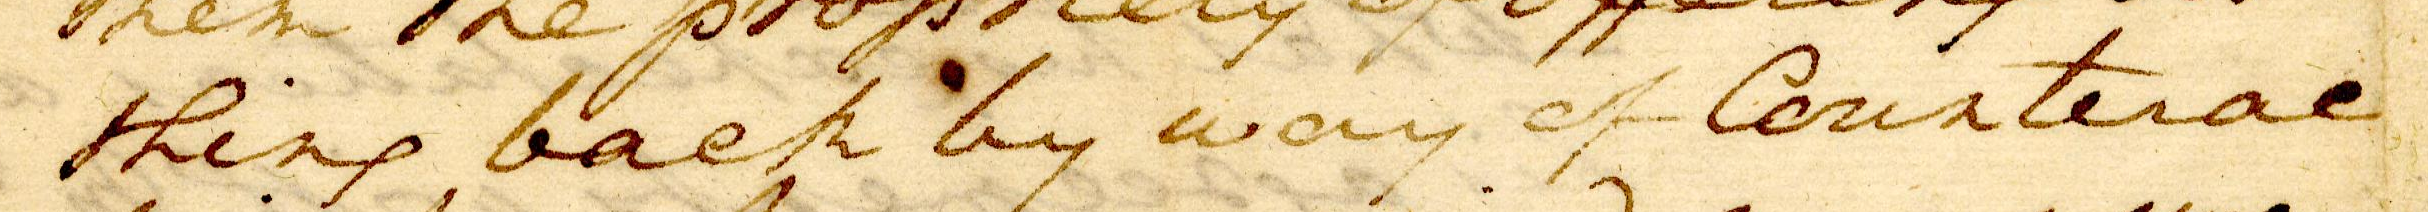thing back by way of Counterac
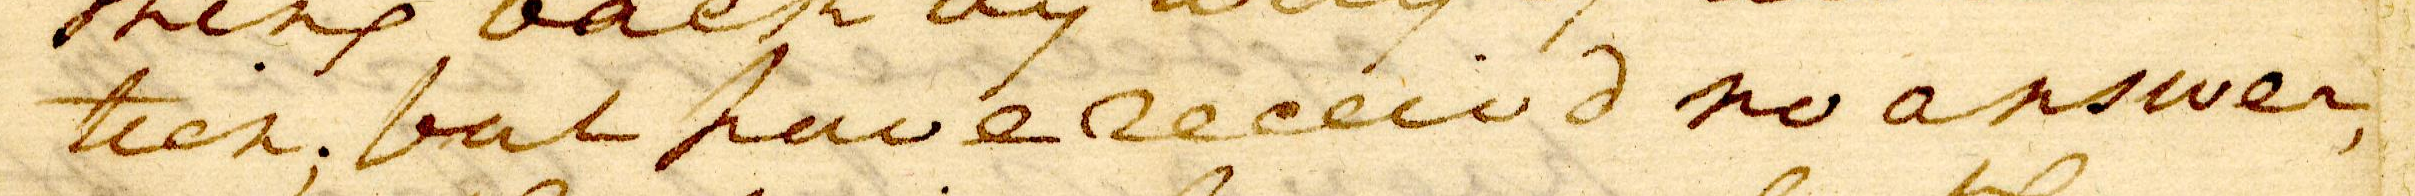tion; but have receiv'd no answer,
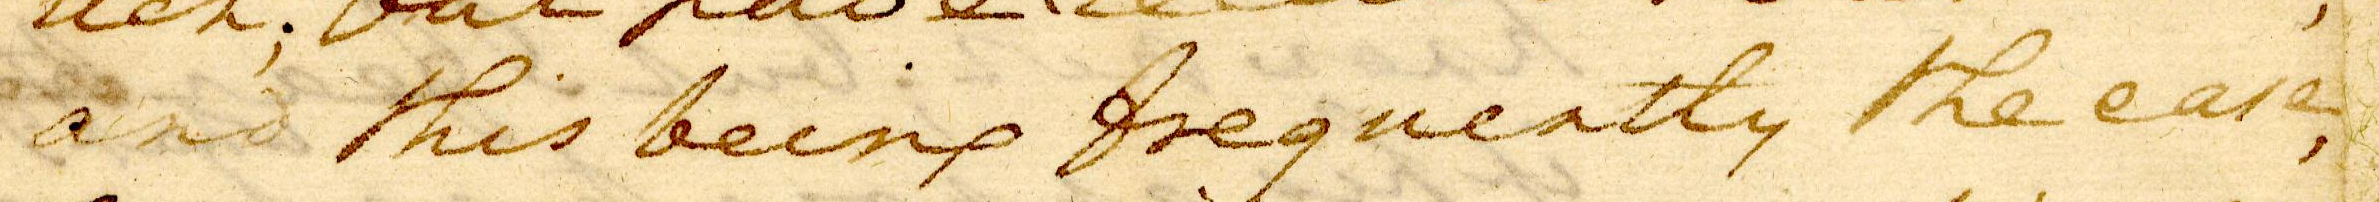and this being frequently the case
